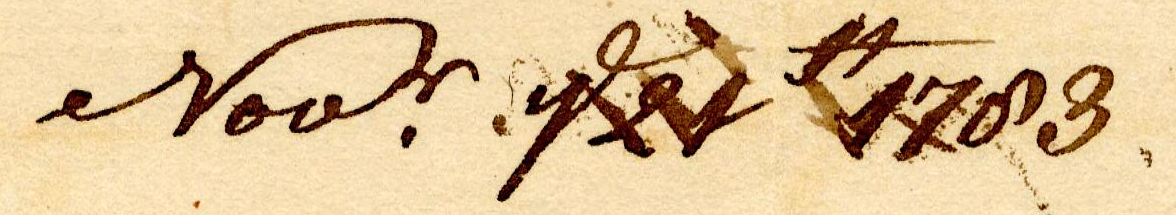Nov^r y^e 21^st 1783
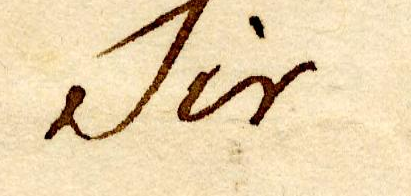Sir
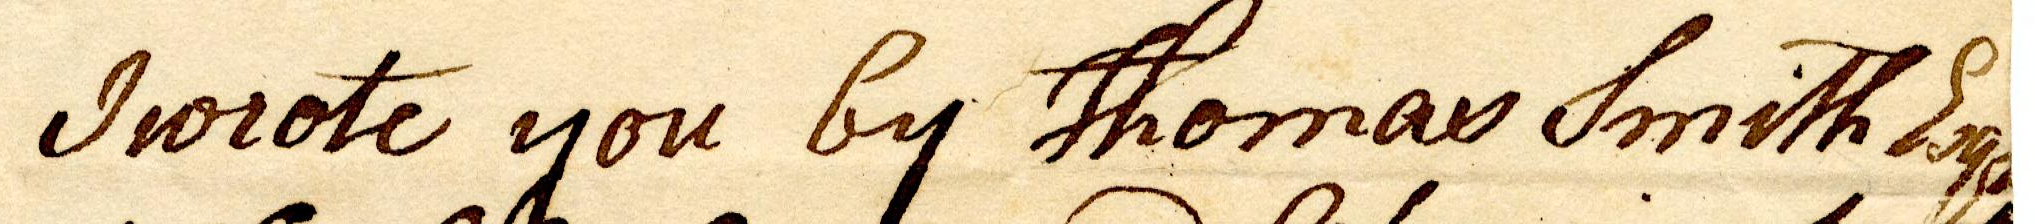I wrote you by Thomas Smith Esq
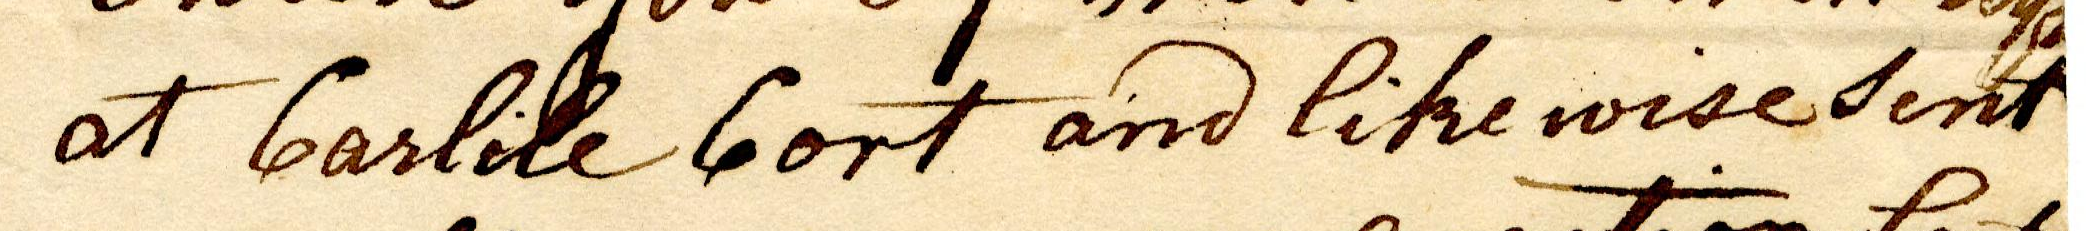at Carlile Cort and likewise sent
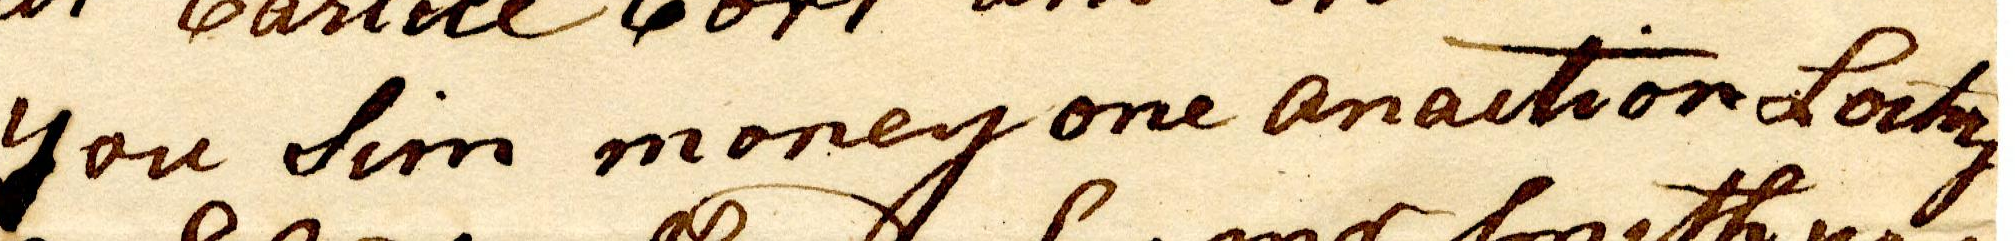you Sim money one an action Lochry,
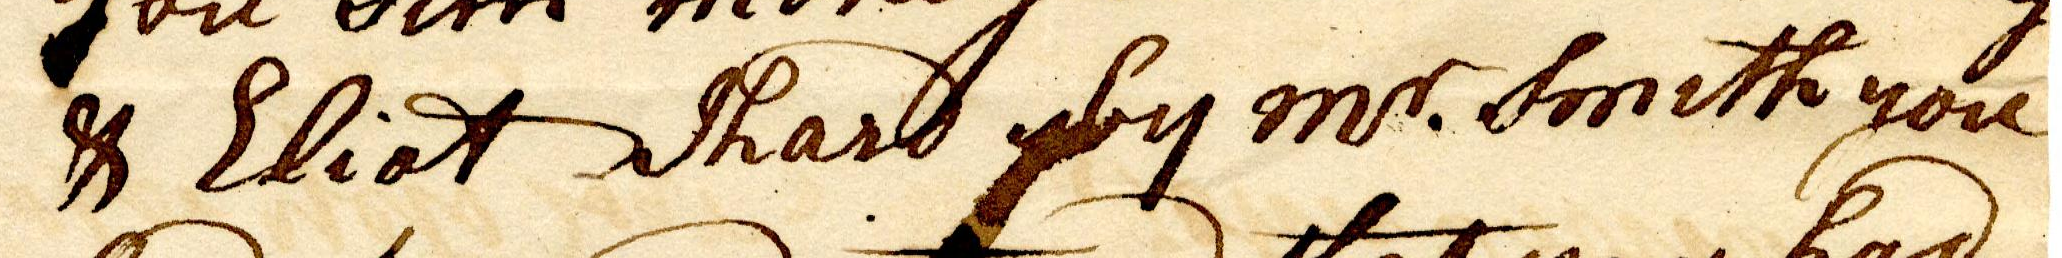& Eliot Shard by M^r. Smith you
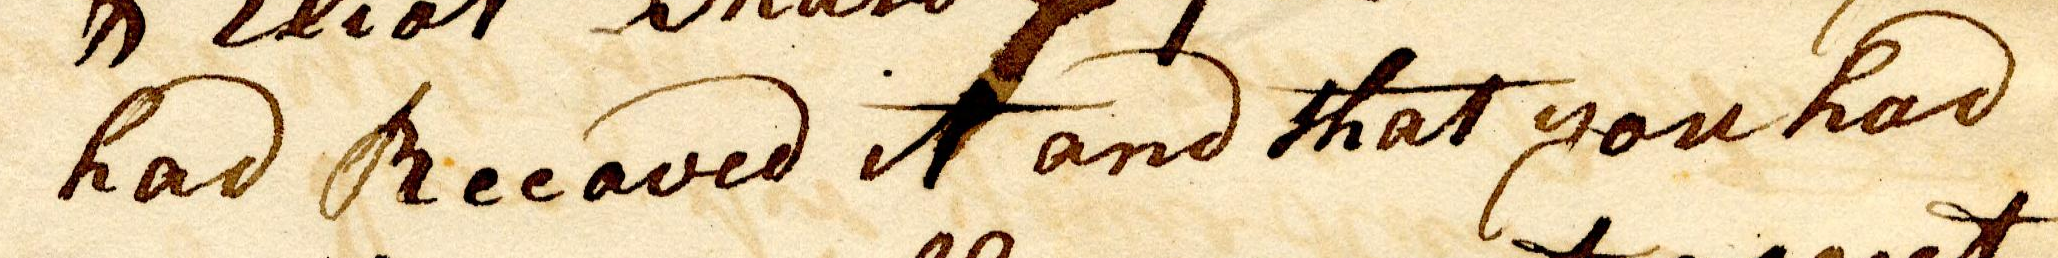had Recaved it and that you had
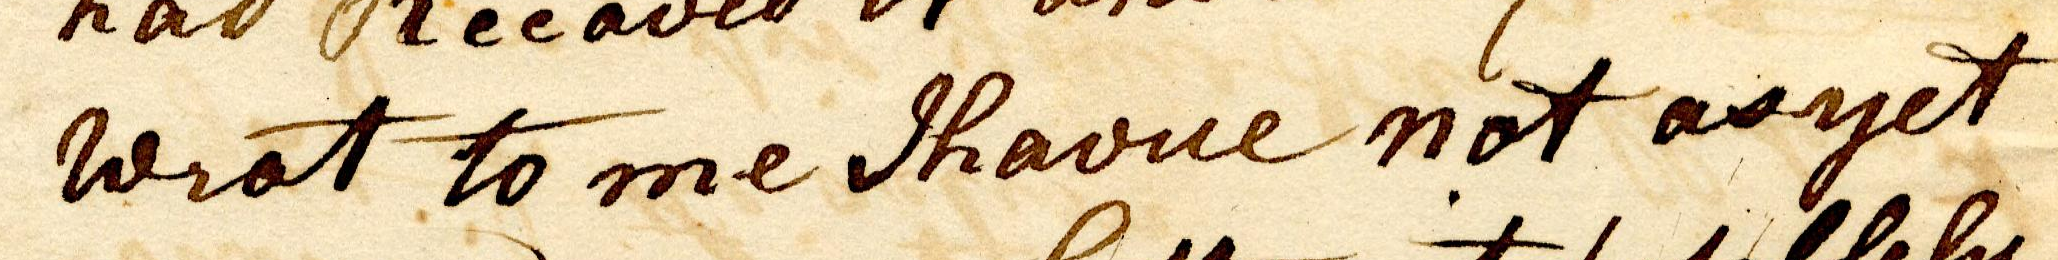wrot to me I havue not as yet
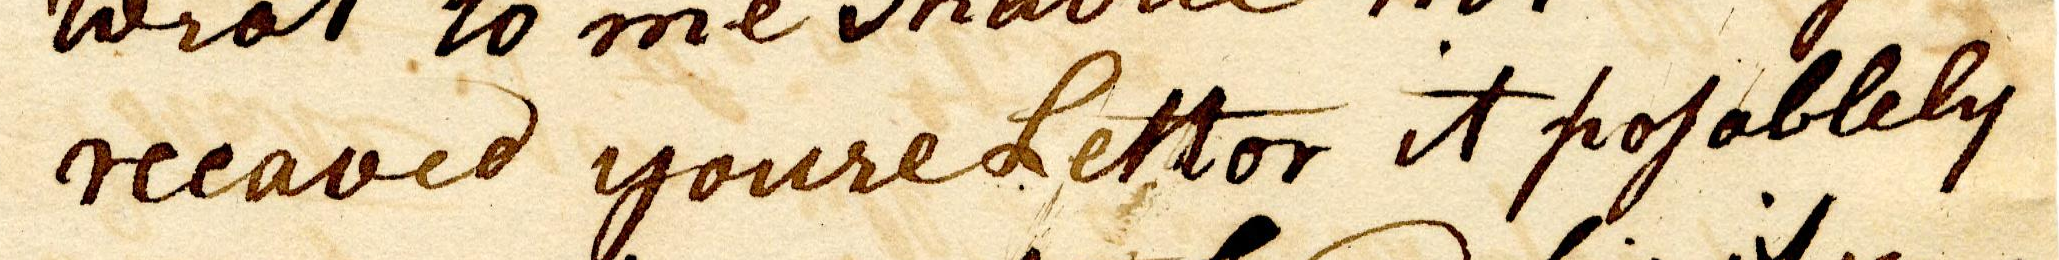recaved youre Lettor it posablely
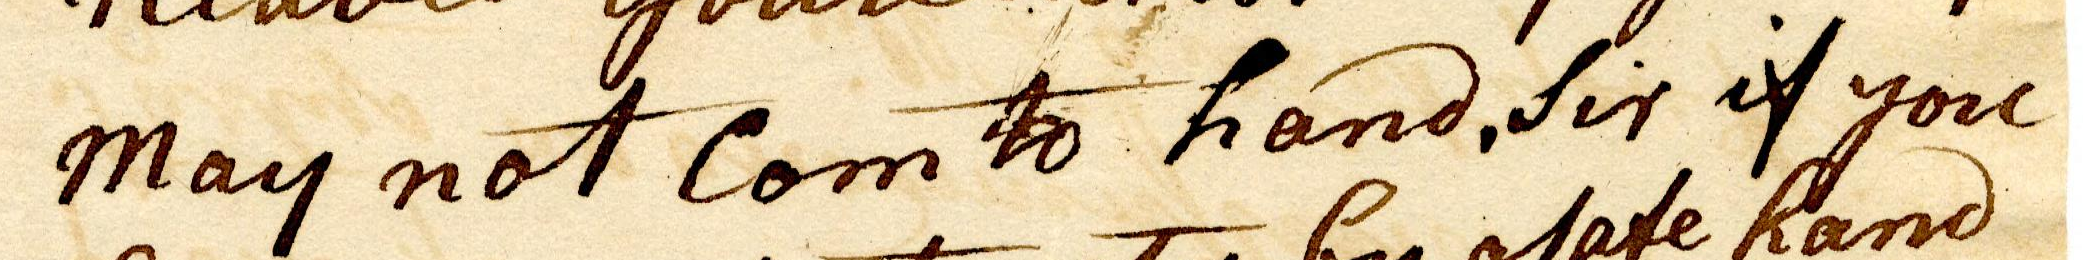May not Com to hand, sir if you
